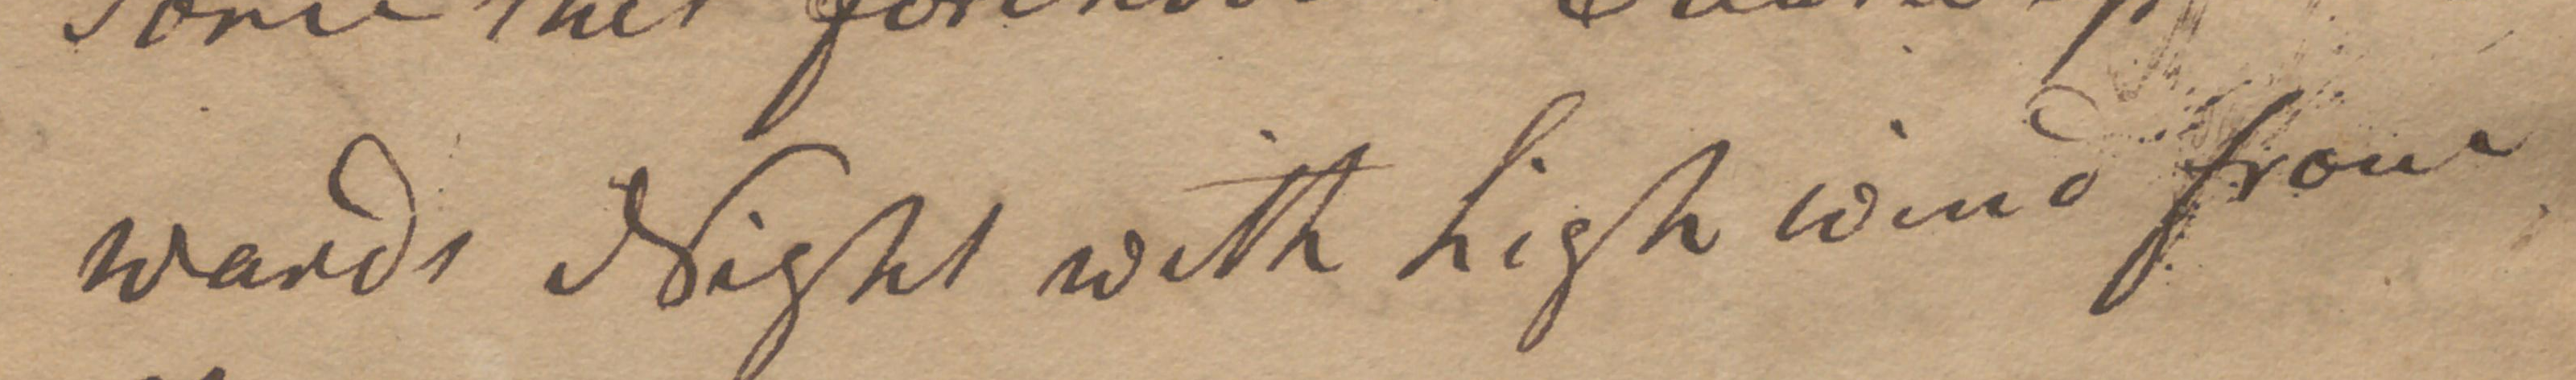wards Night with high wind from
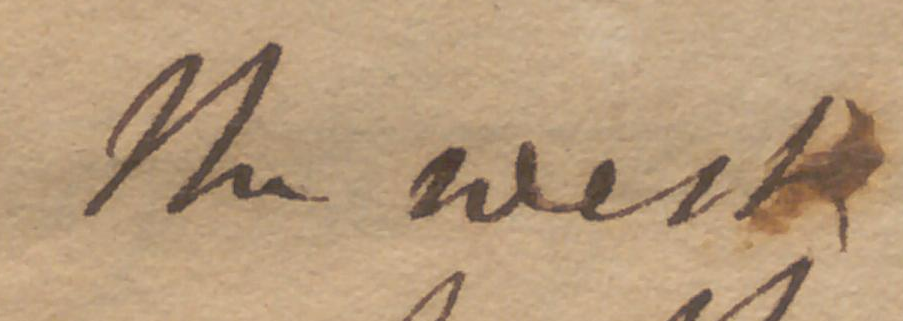the west
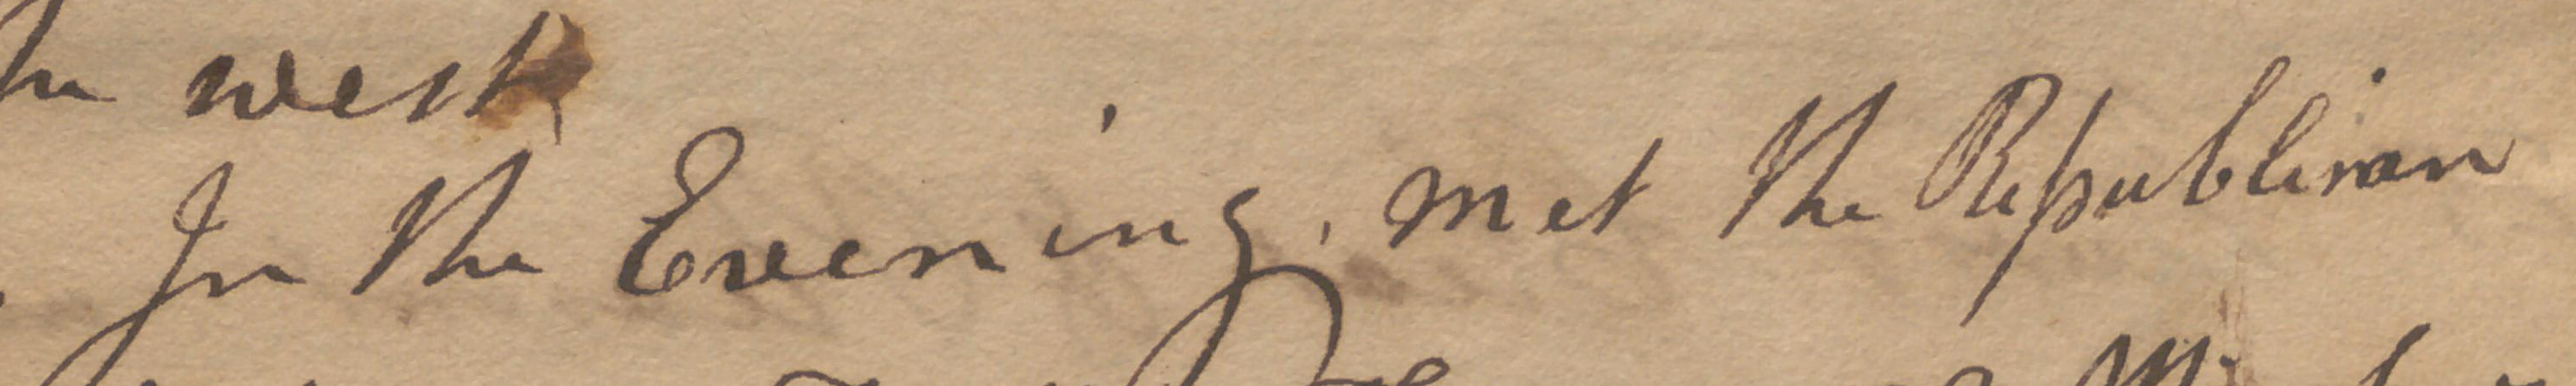In the Evening met the Republican
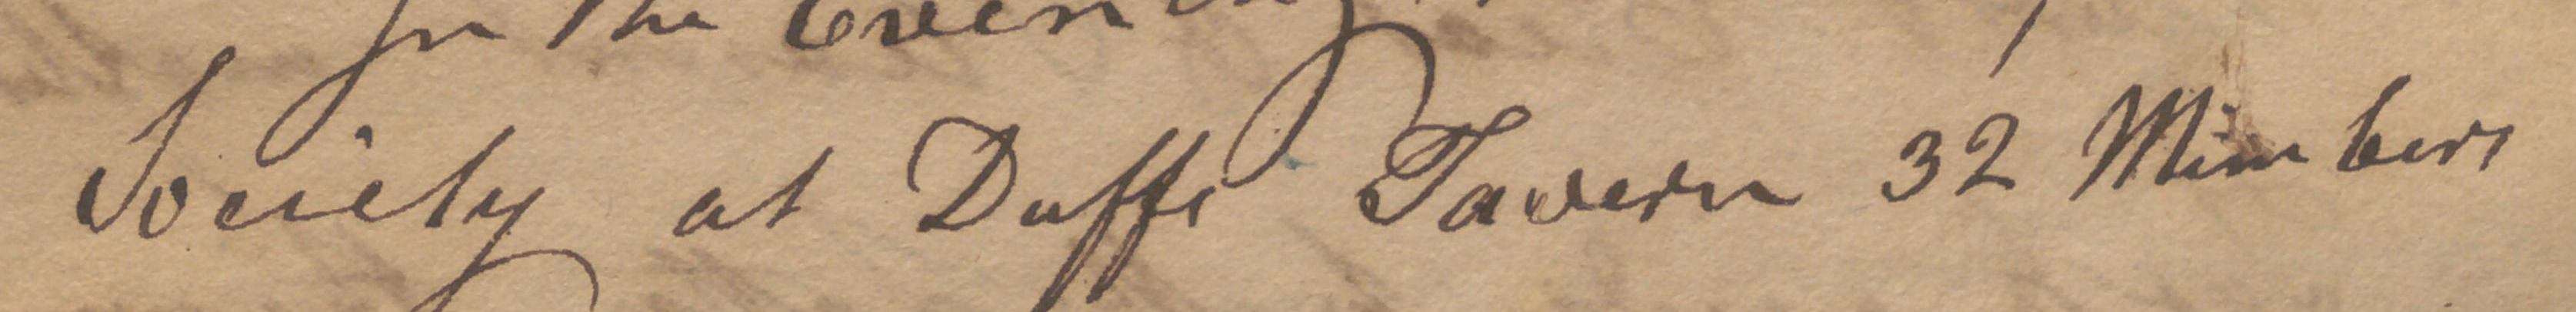Society at Duffs Favern 32 Mimbers
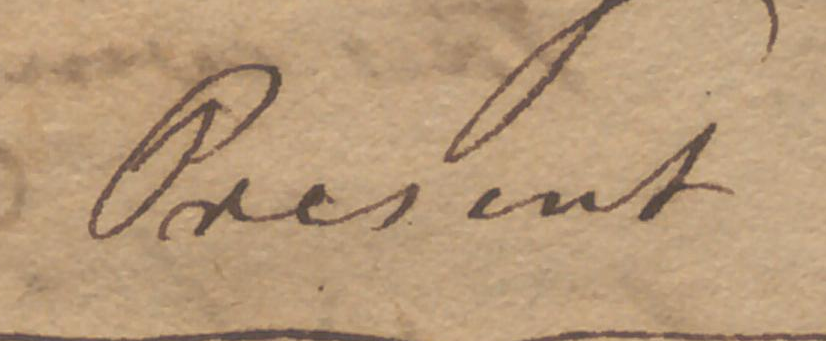Present
